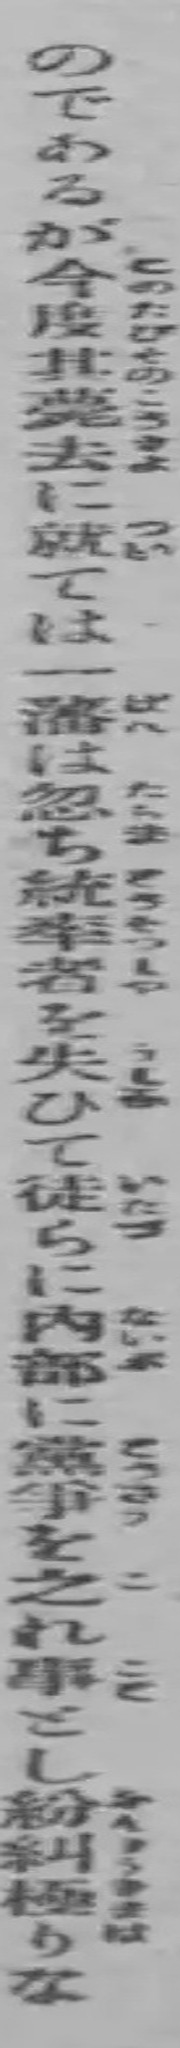のであるが今度其薨去に就ては一藩は忽ち統率者を失ひて徒らに内部の党争を之れ事とし紛糾極りな
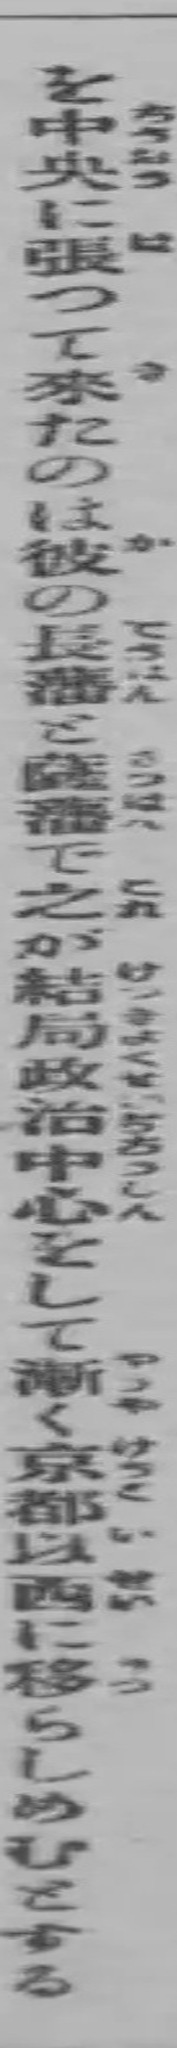を中央に張つて来たのは彼の長藩と薩藩で之が結局政治中心をして漸く京都以西に移らしめむとする
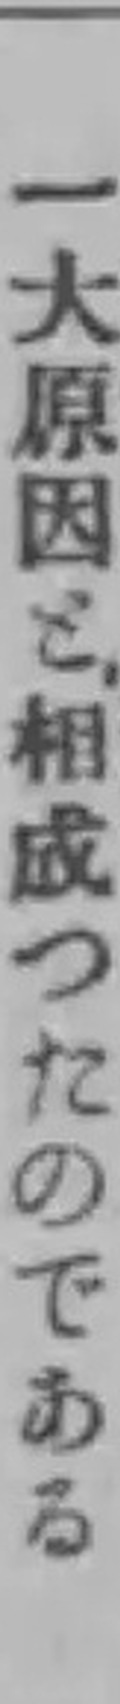一大原因と相成つたのである
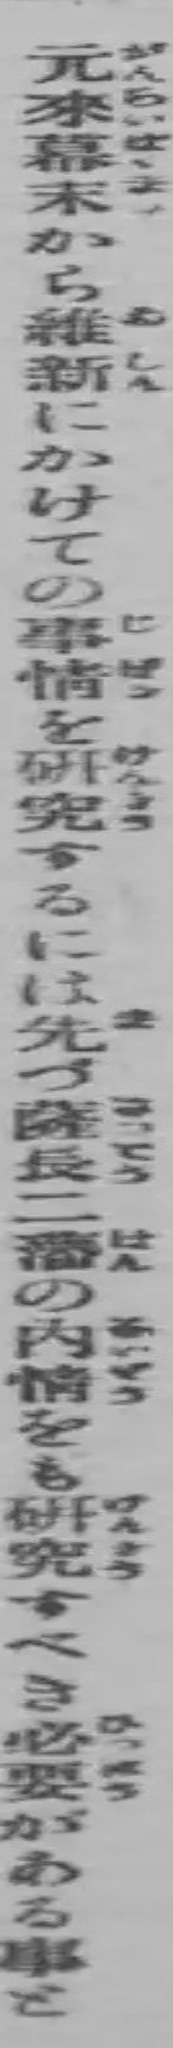元来幕末から維新にかけての事情を研究するには先づ薩長二藩の内情をも研究すべき必要がある事と
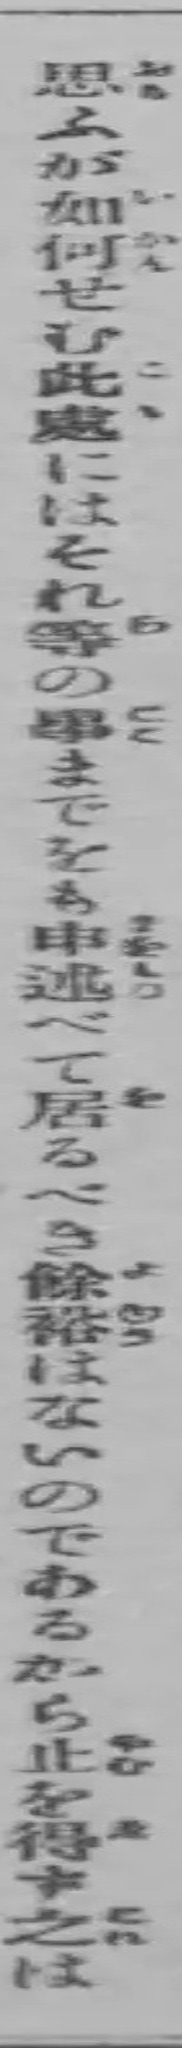思ふが如何せむ此処にはそれ等の事までをも申述べて居るべき余裕はないのであるから止を得ず之は
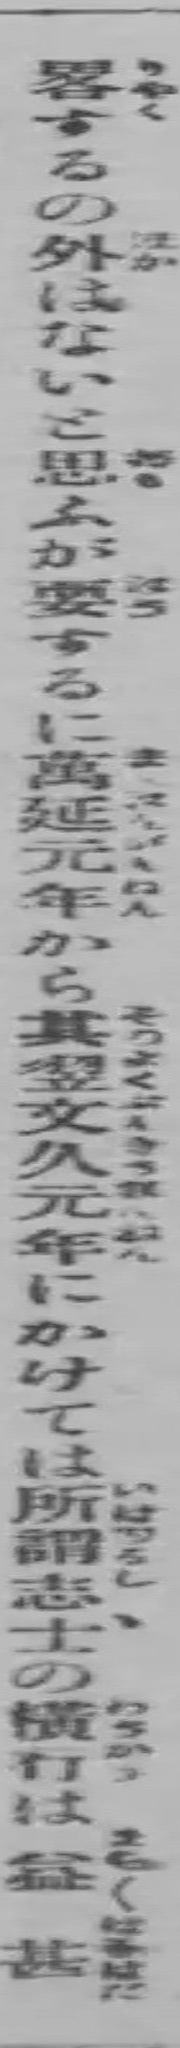略するの外はないと思ふが要するに万延元年から其翌文久元年にかけては所謂志士の横行は益甚
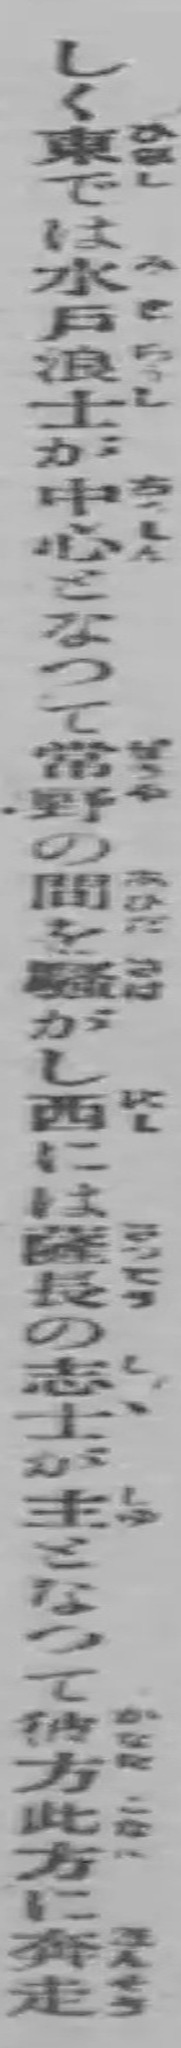しく東では水戸浪士が中心となつて常野の間を騒がし西には薩長の志士が主となつて彼方此方に奔走
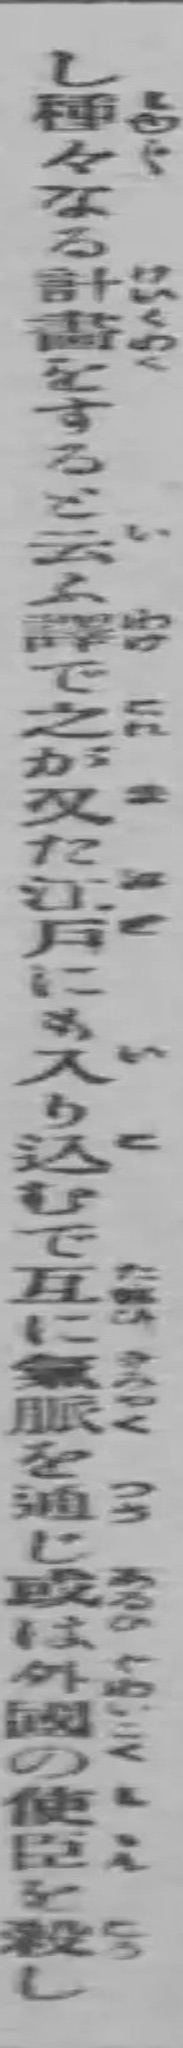し種々なる計画をすると云ふ訳で之が又た江戸にも入り込むで互に気脈を通じ或は外国の使臣を殺し
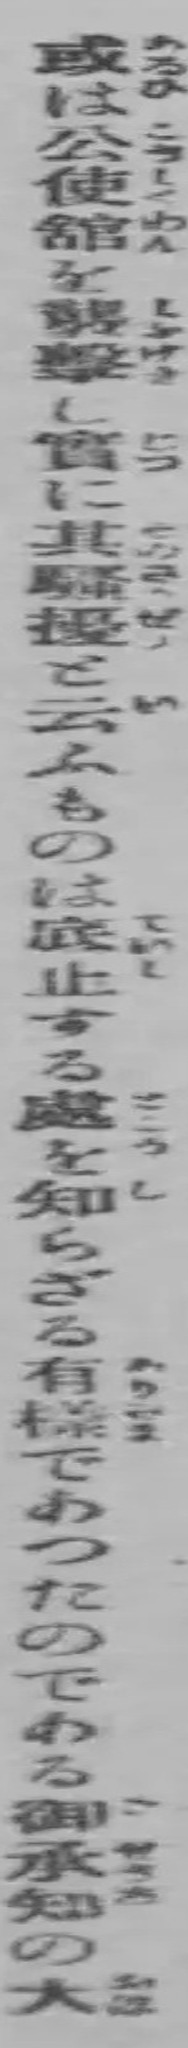或は公使館を襲撃し実に其騒擾と云ふものは底止する処を知らざる有様であつたのである御承知の大
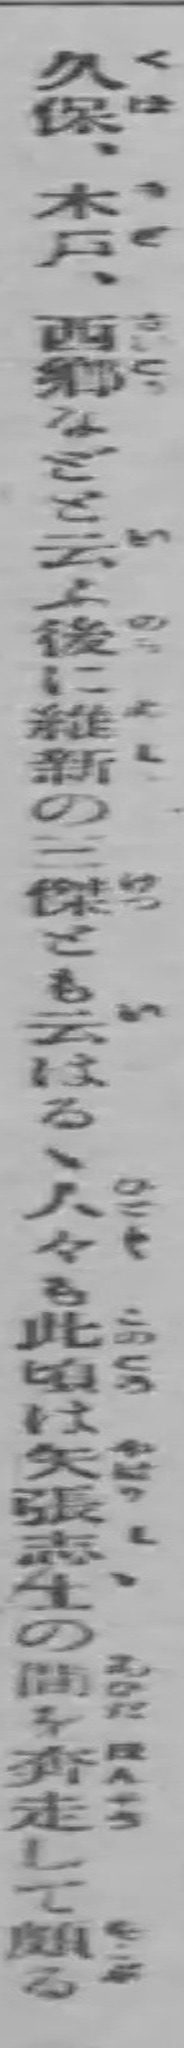久保、木戸、西郷などと云ふ後に維新の三傑とも云はるゝ人々も此頃は矢張志士の間を奔走して頗る
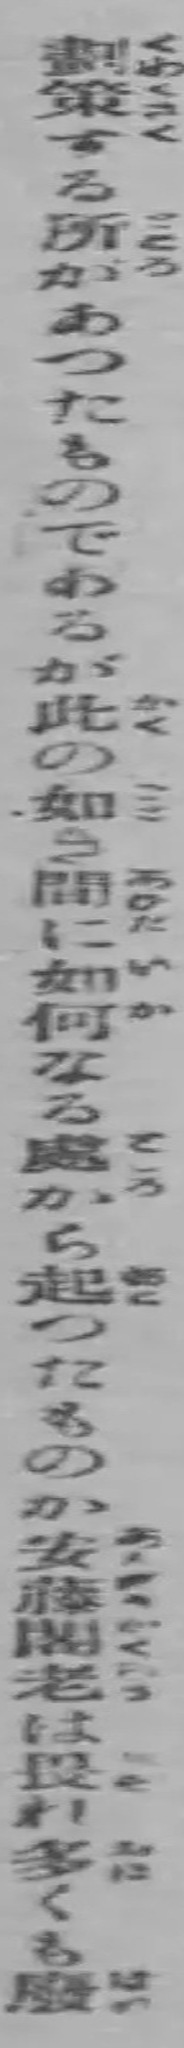画策する所があつたものであるが此の如き間に如何なる処から起つたものか安藤閣老は畏れ多くも廃

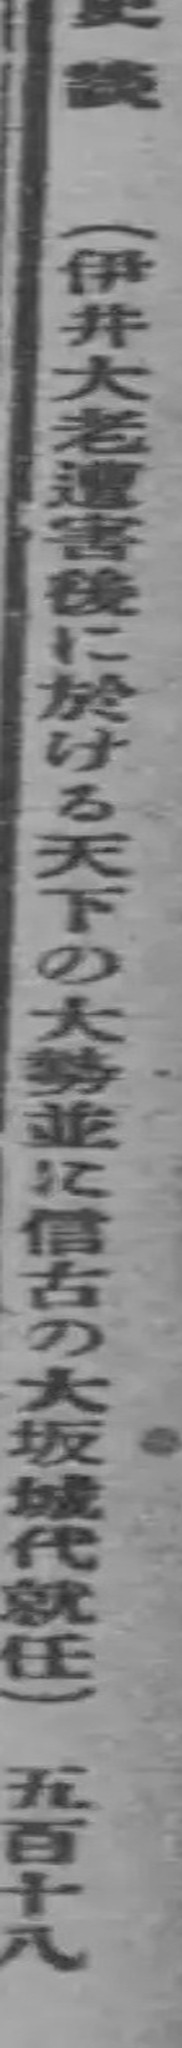豊橋市史談(井伊大老遭害後に於ける天下の大勢並に信古の大坂城代就任)五百十八
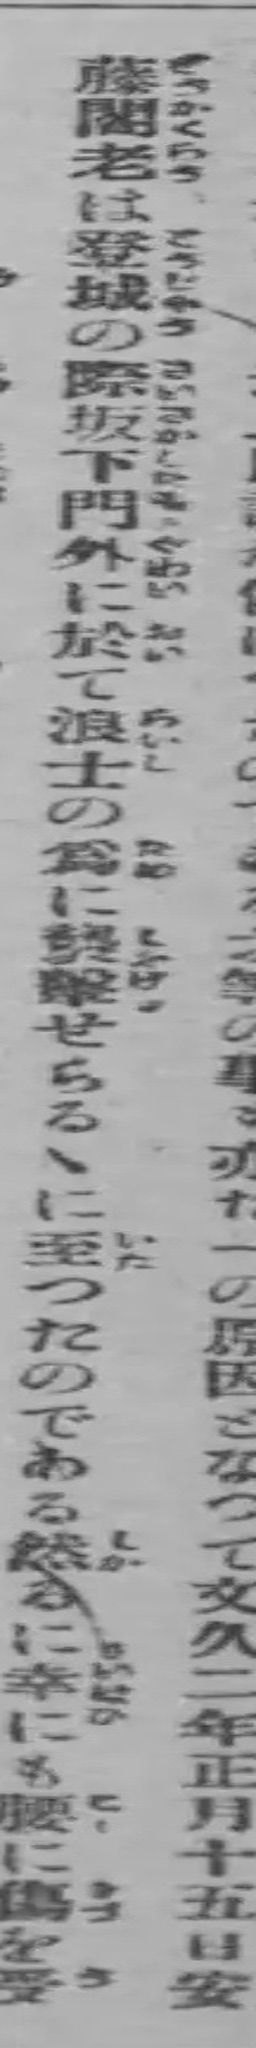藤閣老は登城の際坂下門外に於て浪士の為に襲撃せらるゝに至つたのである然るに幸にも腰に傷を受
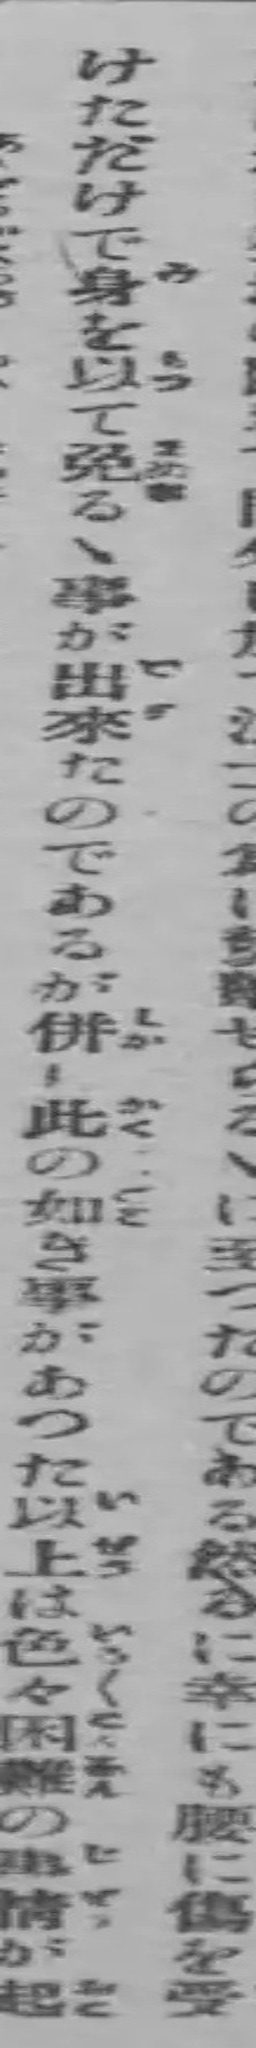けただけで身を以て免るゝ事が出来たのであるが併し此の如き事があつた以上は色々困難の事情が起
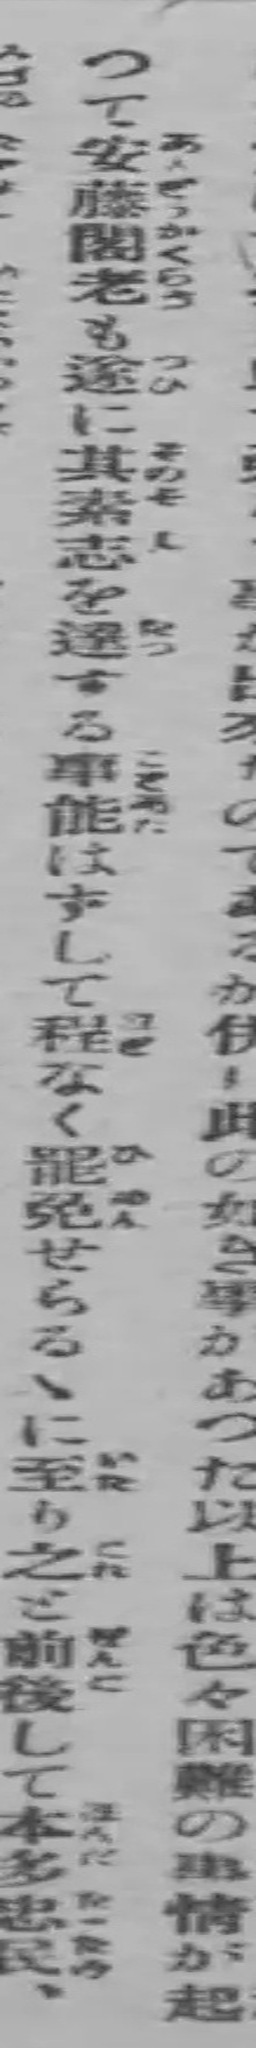つて安藤閣老も遂に其素志を達する事能はずして程なく罷免せらるゝに至り之と前後して本多忠民、
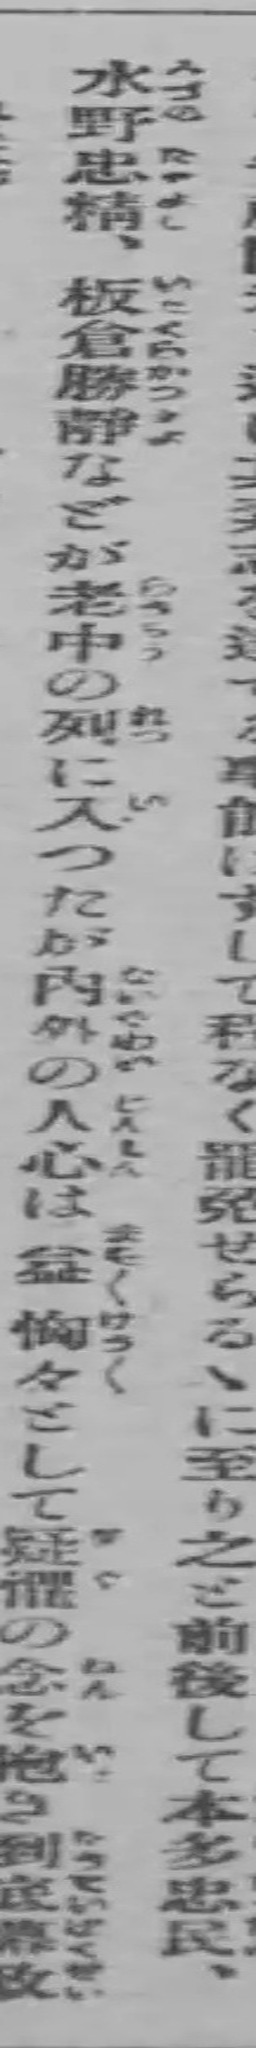水野忠精、板倉勝静などが老中の列に入つたが内外の人心は益恟々として疑懼の念を抱き到底幕政
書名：豊橋市史談
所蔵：国立国会図書館 National Diet Library, JAPAN
